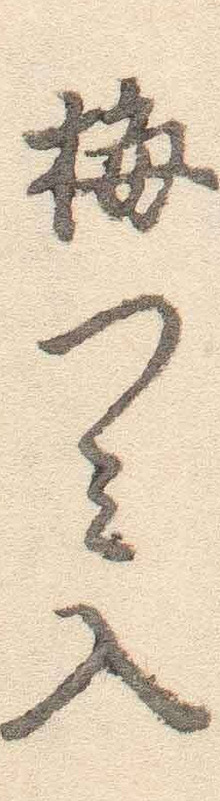梅つみ入
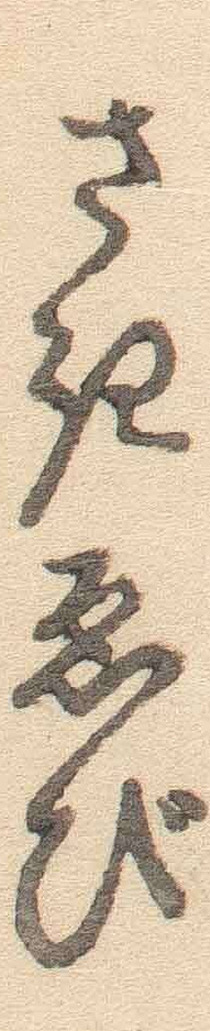さきゑび

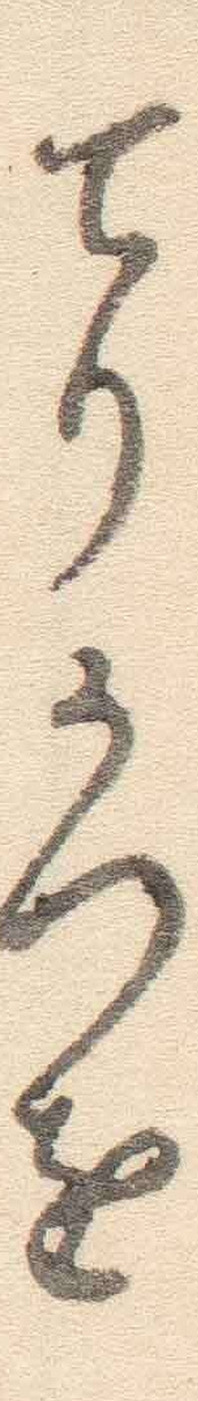てりかつを
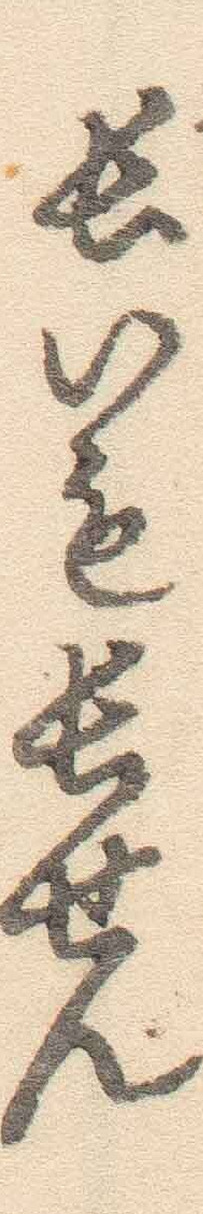長いも長せん
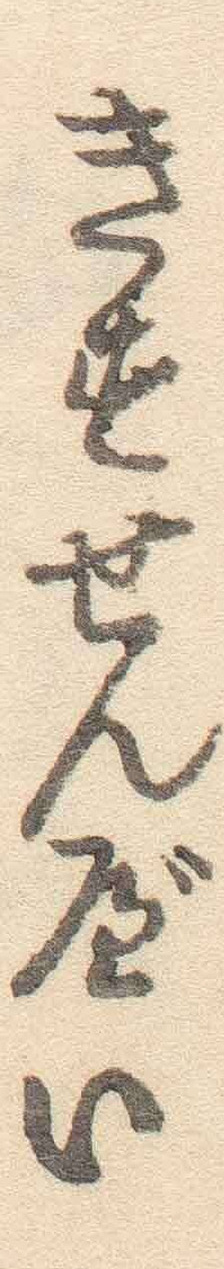きすせんべい
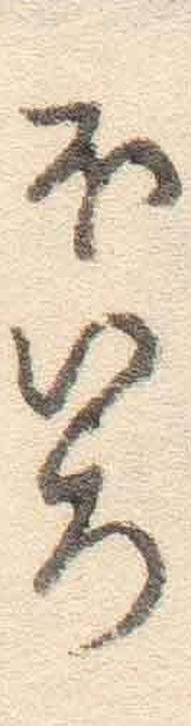ほいろ
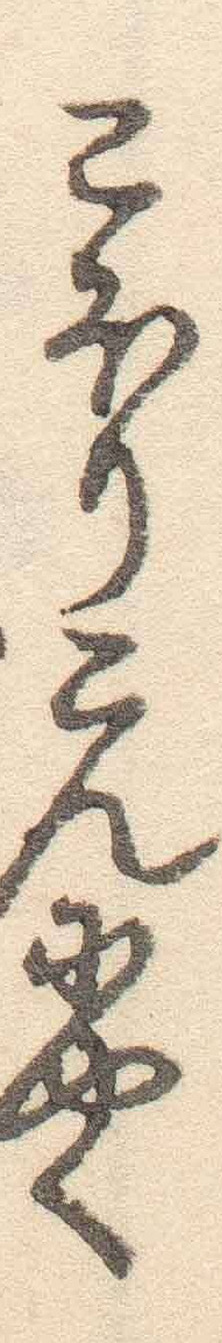こほりこんにやく
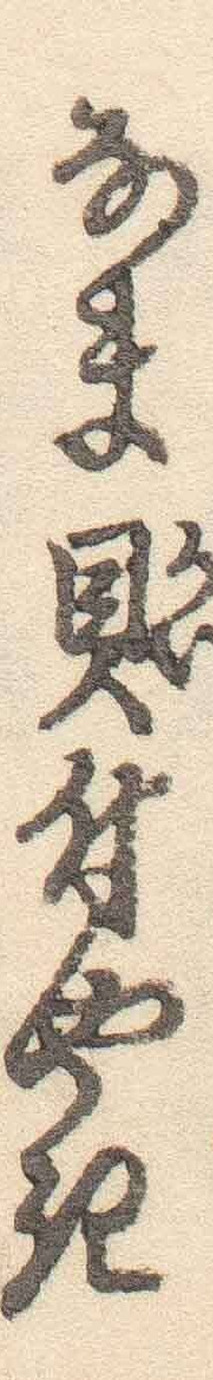なま貝付やき
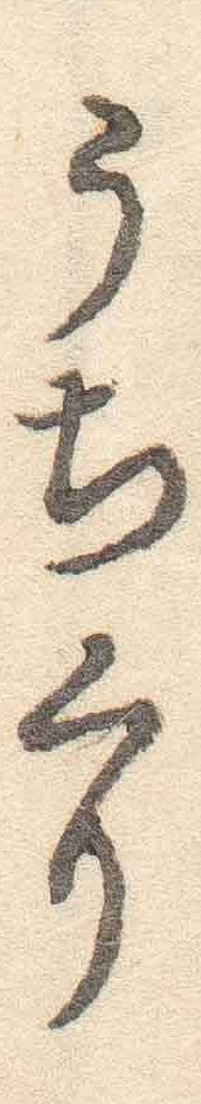うちくり
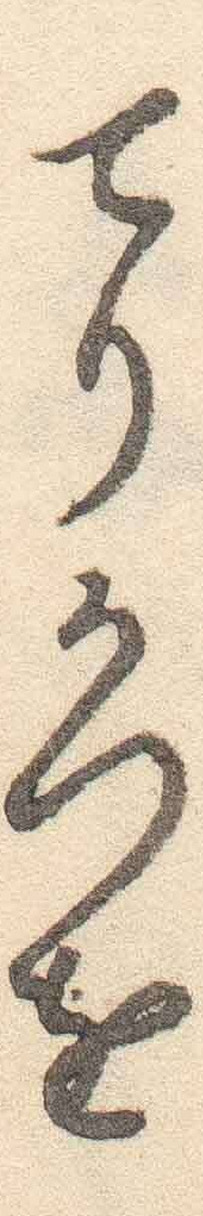てりかつを
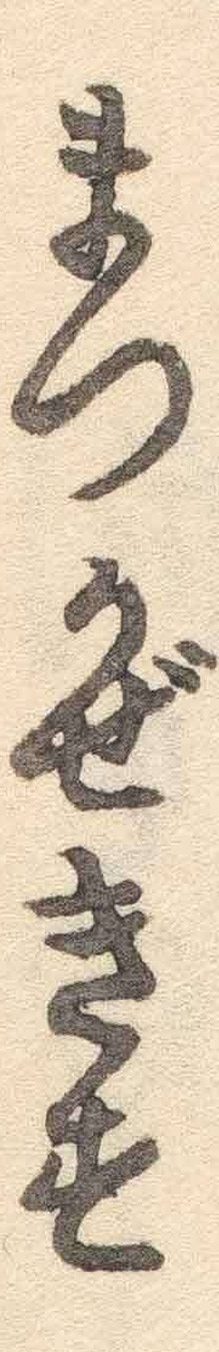まつかぜきす
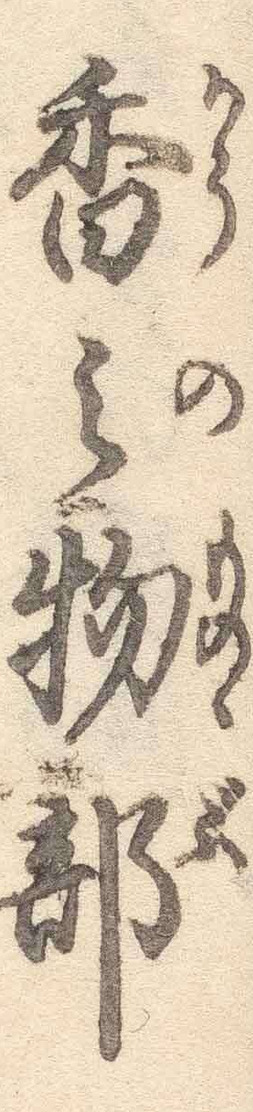香之物部
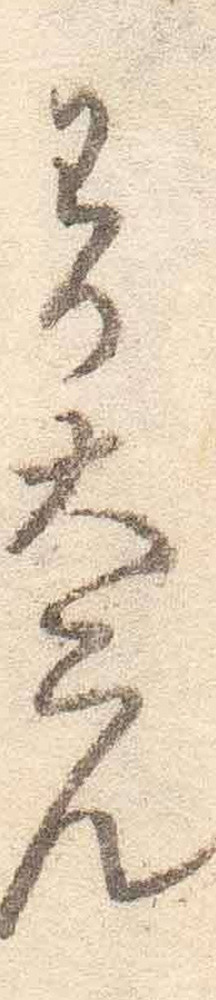わり大こん
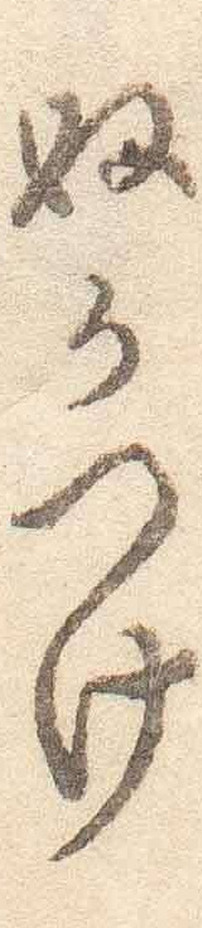ぬかつけ
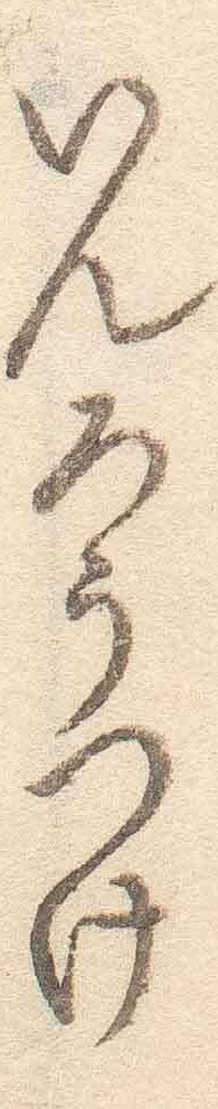いんろうつけ
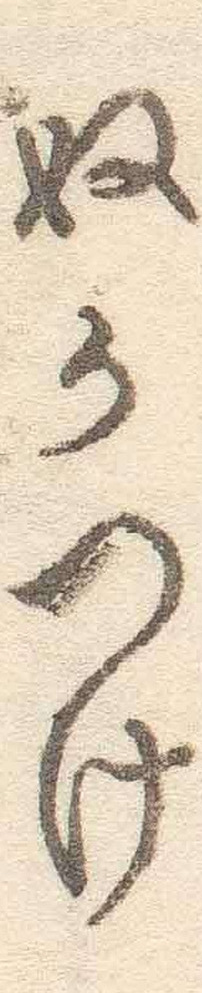ぬかつけ
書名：料理通
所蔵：東京学芸大学附属図書館 国文学研究資料館
